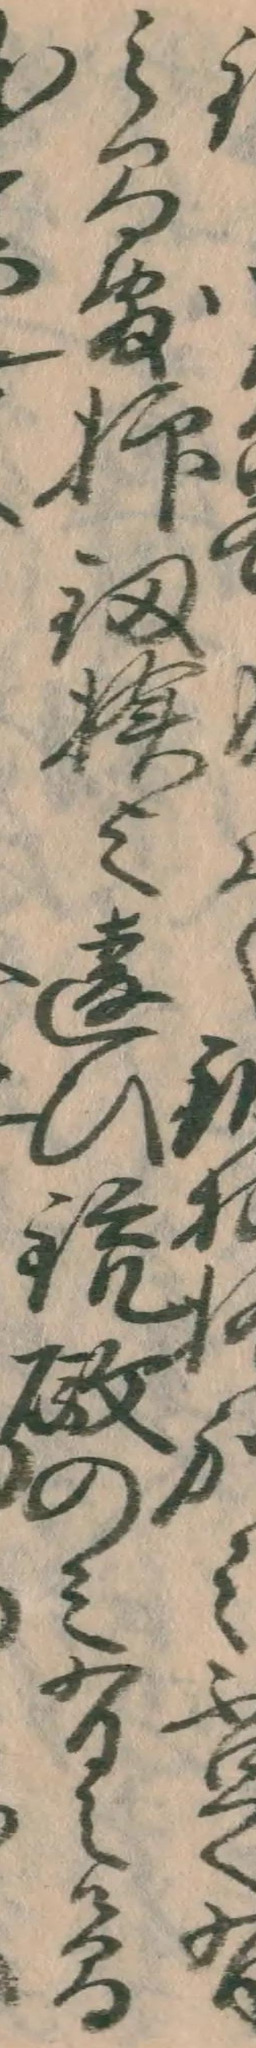之間敷抑剱槍と違ひ銃礮のミ有之候間
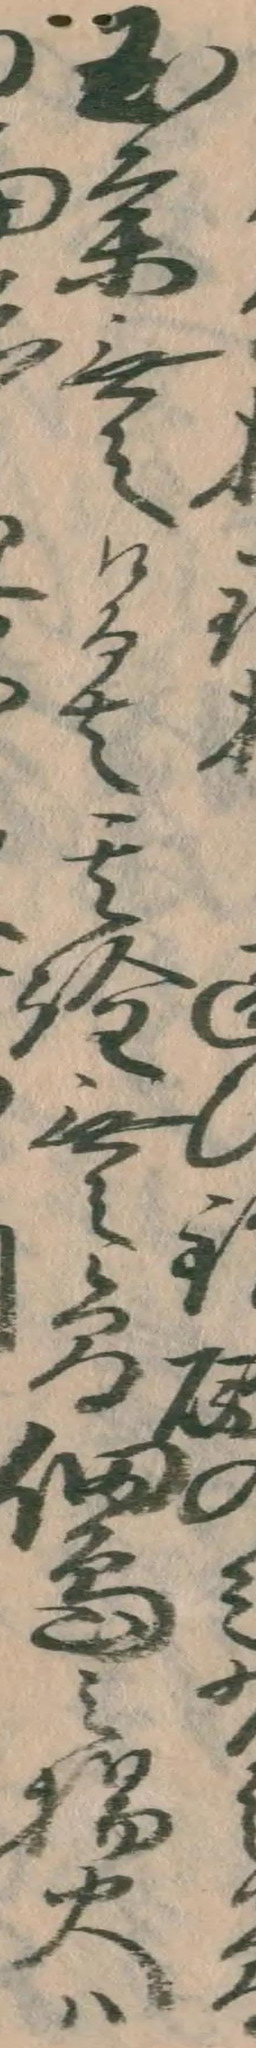玉薬無之候而者其詮無之候間佃島之揚火ハ
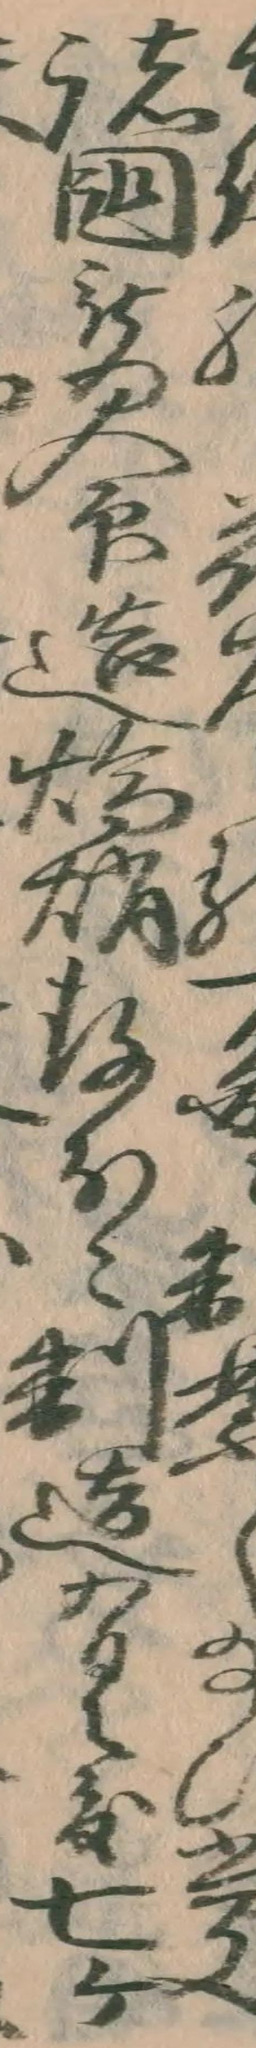諸国被為命造焔硝存分にニ制造有之度七ケ
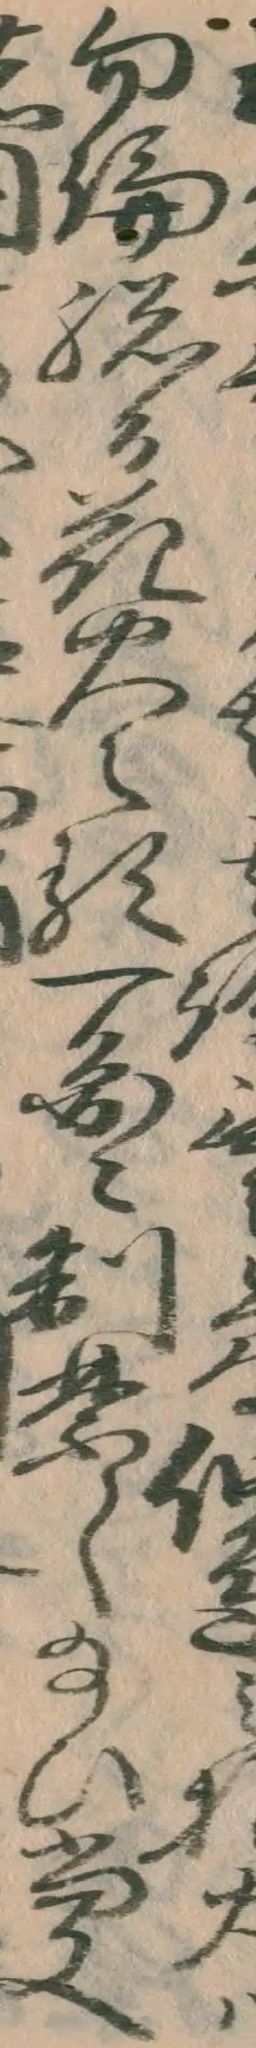勿論総而花火之類一圓ニ制禁し玉ひ尚又
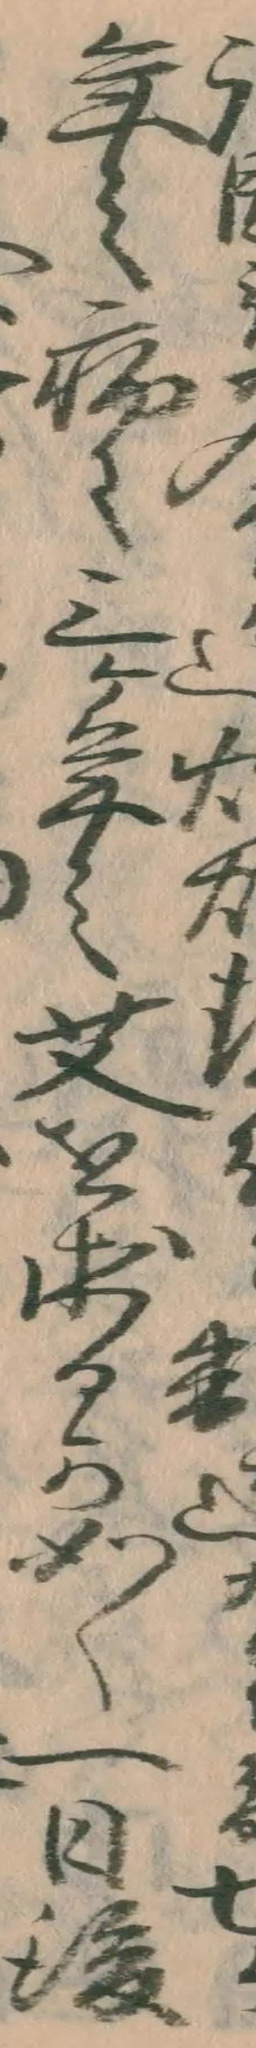年之病に三ケ年之艾を求るか如く一日後
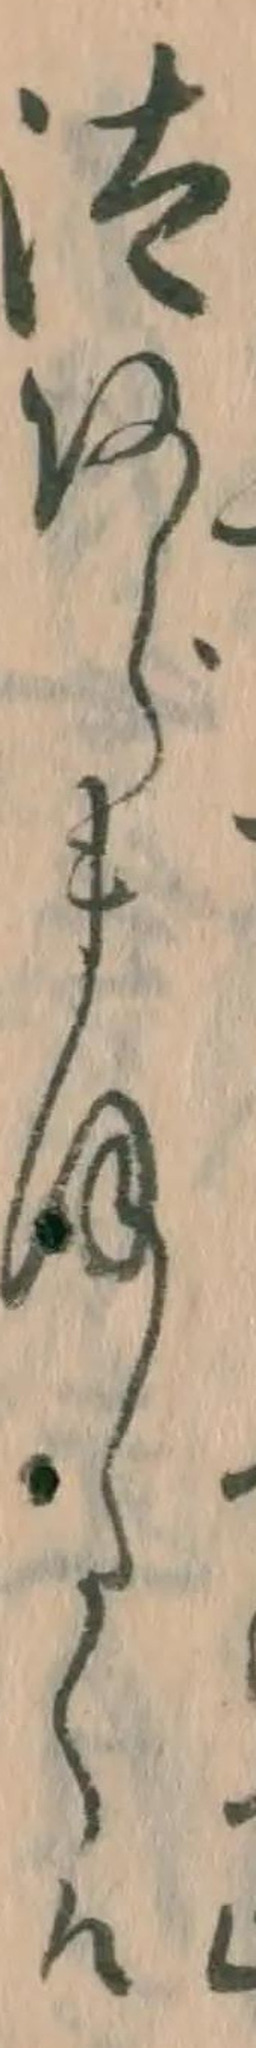汰あらまほしく候
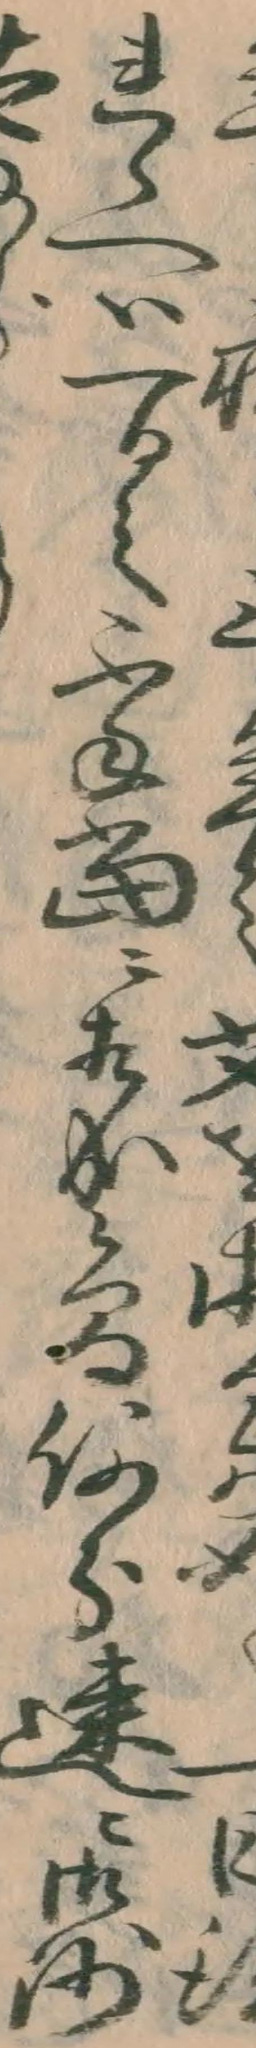れ候へハ一日之不手當ニ相成候間何分速ニ御沙
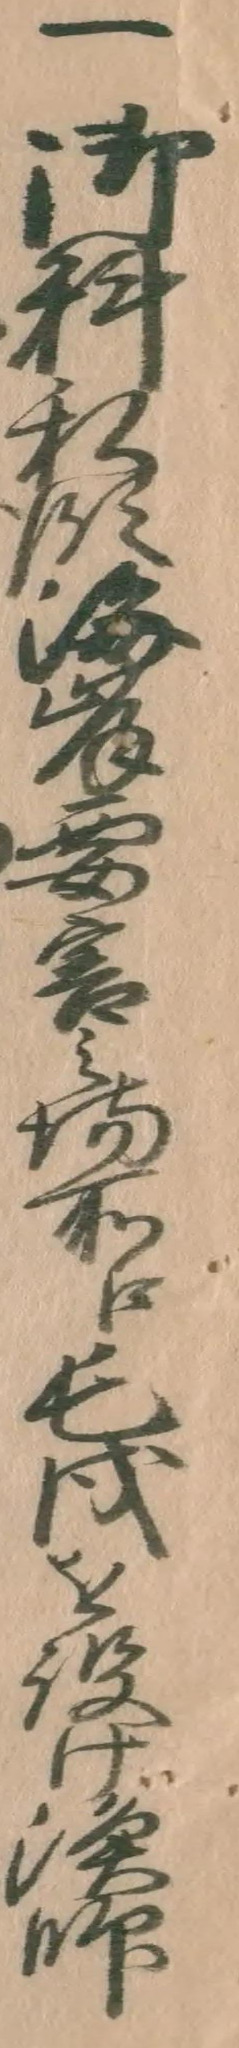一御料私領海岸要害之場所江屯戌を設け漁師
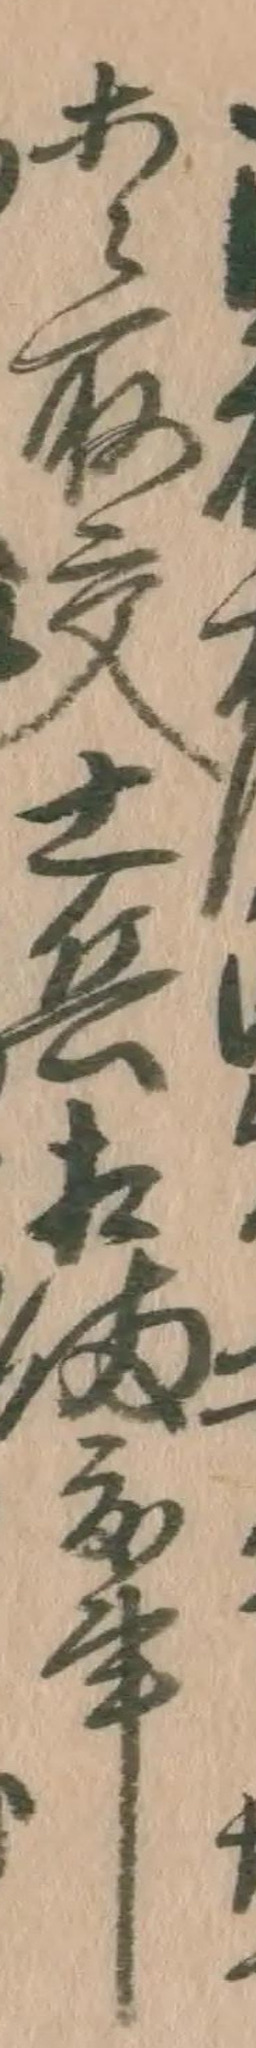等ニ取交士兵相備度事
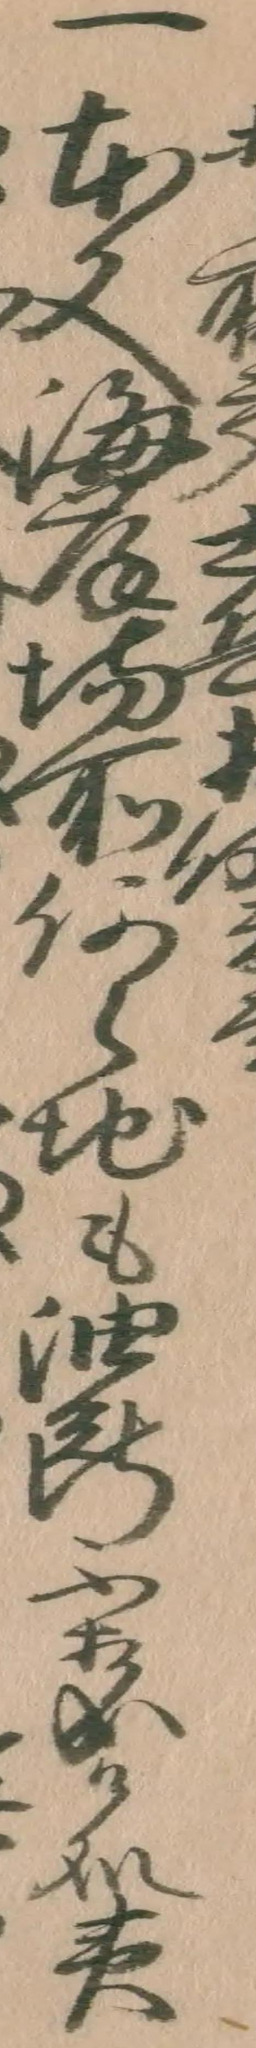一本文海岸場所何之地も油断不相成候処夷
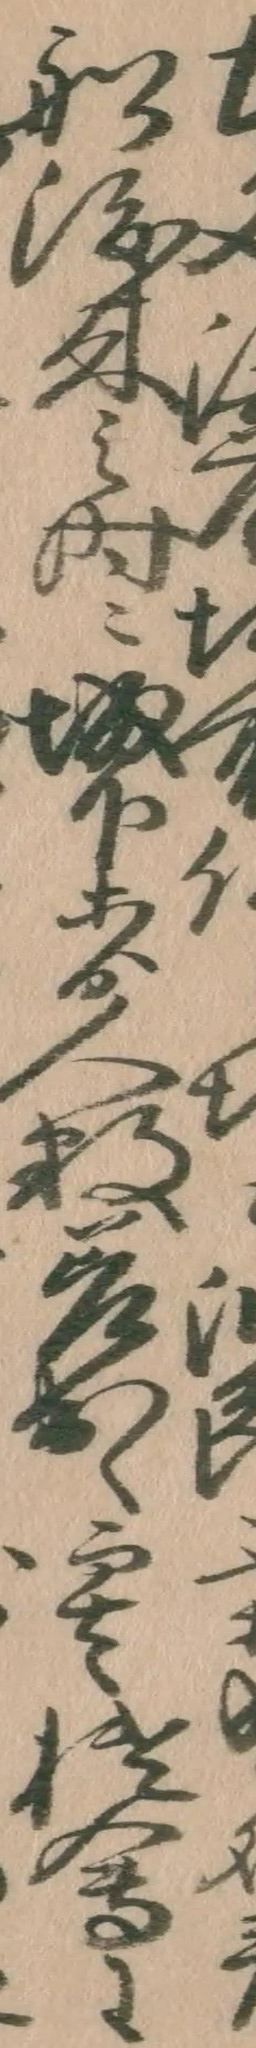船渡来之時ニ城下等ゟ人数差出候而者機會に
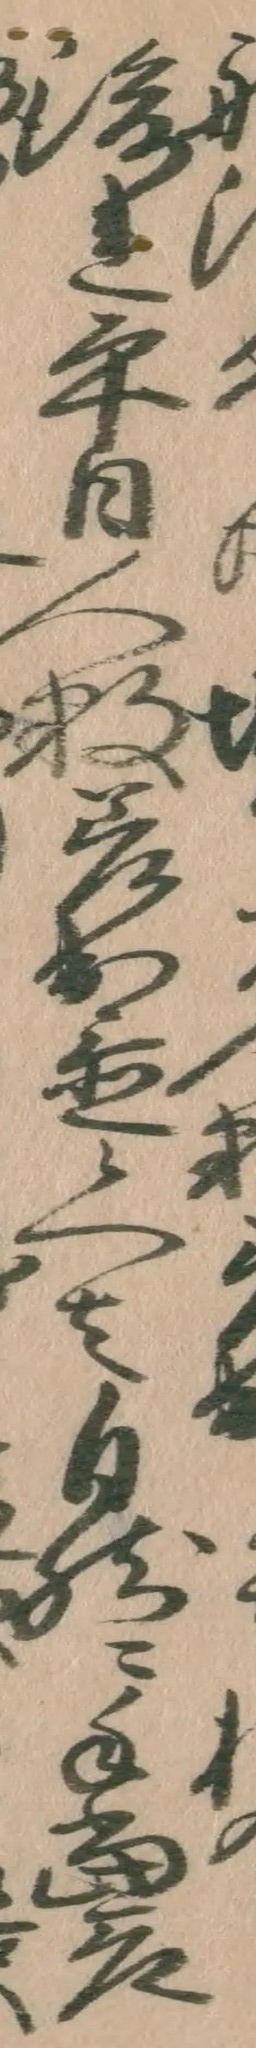後れ平日人数差出置候へ者自然ニ手當差
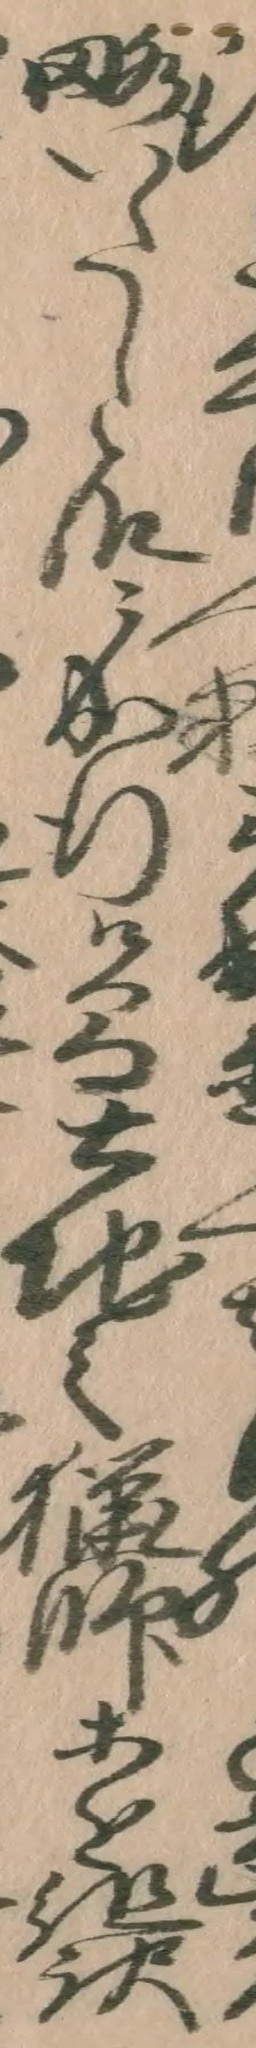略いたし候様ニ成行候間土地之猟師等を組訳
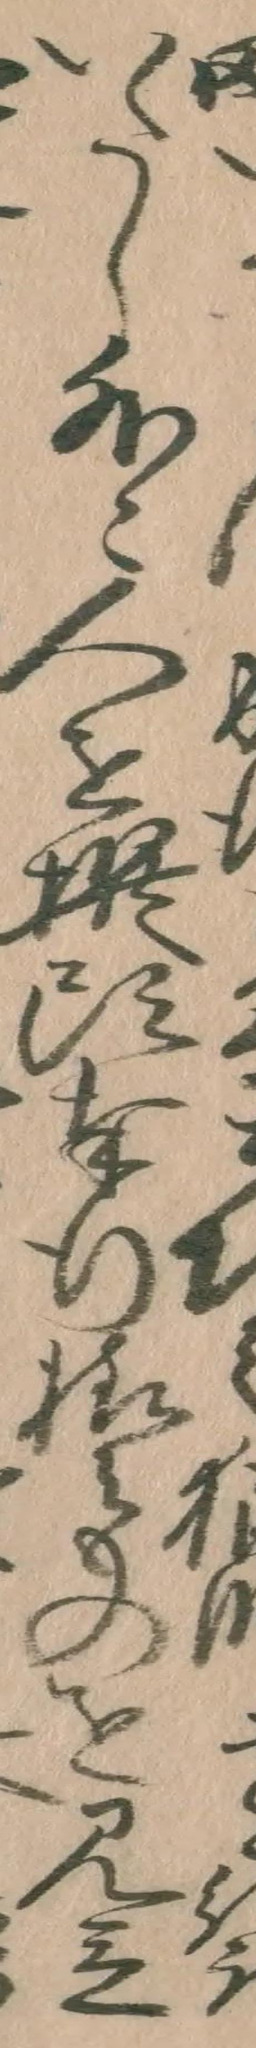いたし外ニ人を撰頭奉行様之ものを見立
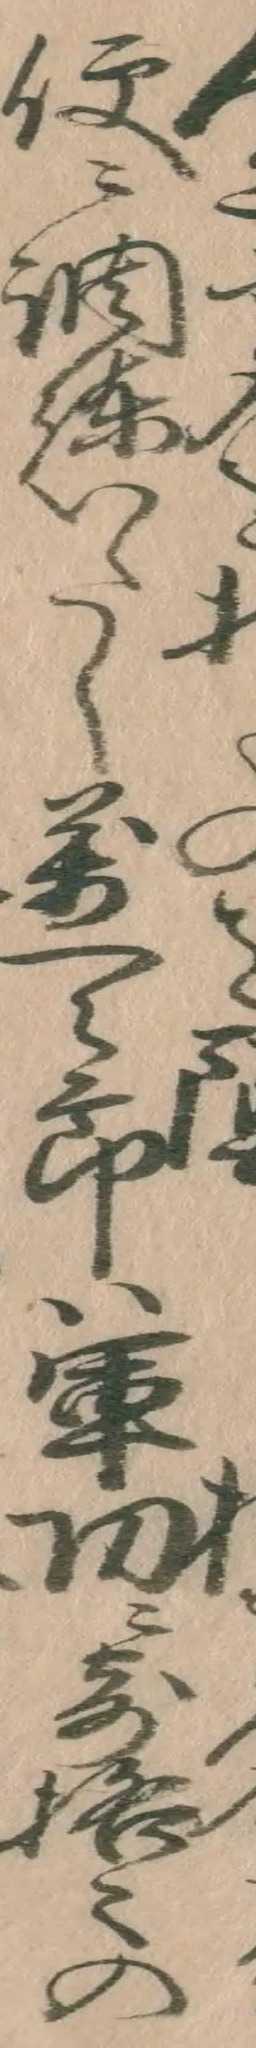便ニ調錬いたし萬一之節ハ軍功ニ寄格々の
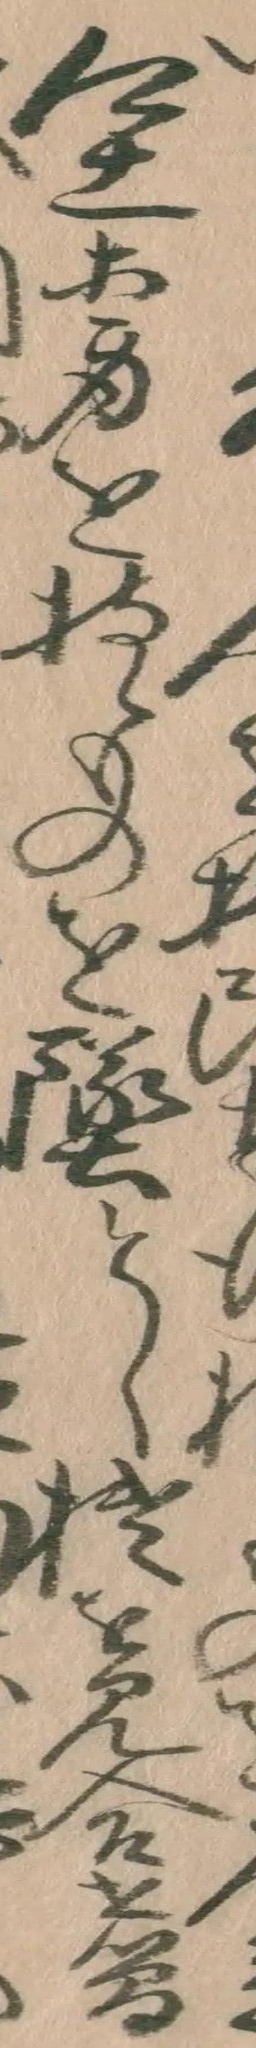郷士等身を持ち候ものを隊士とし機を見合せ簡
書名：麗斎叢書. 20
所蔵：国立国会図書館 National Diet Library, JAPAN
